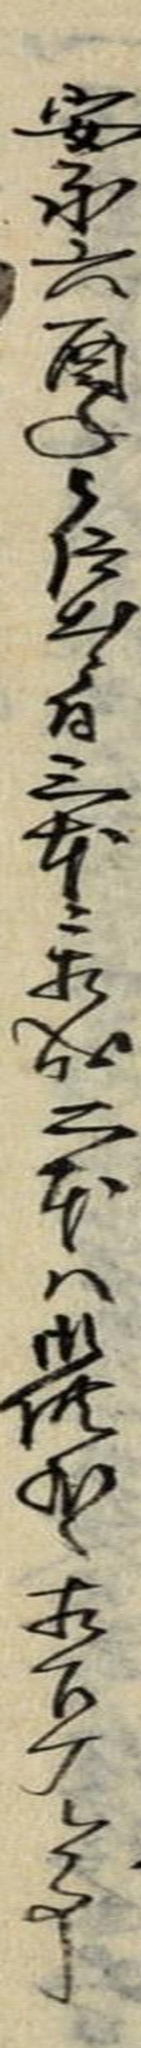安永六酉年被仰出候付三本に相成二本は御供外へ相下け候事
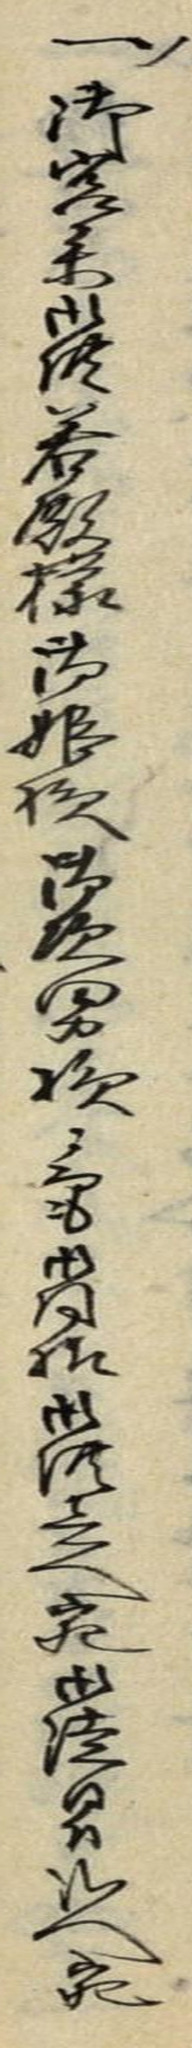一御宮参御供若殿様御姫様御次男様にても御同様御供壱人宛御徒目付弐人宛
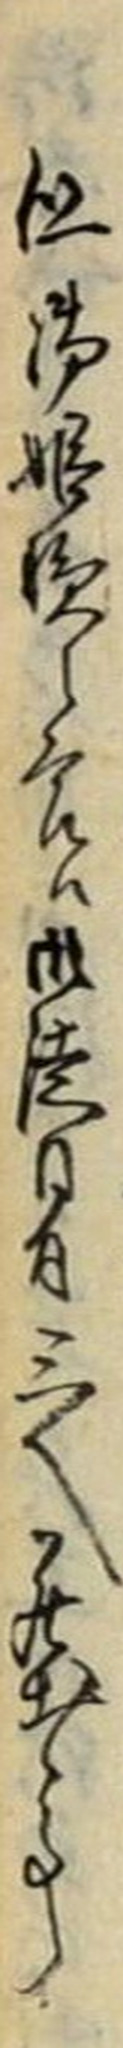但御姫様之節は御徒目付三人罷出候事
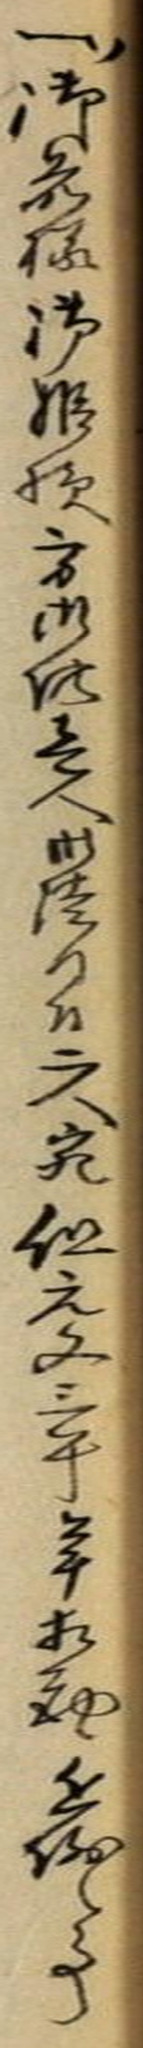一御前様御姫様方御供壱人御徒目付二人宛但元文三午年相勤候近例之事
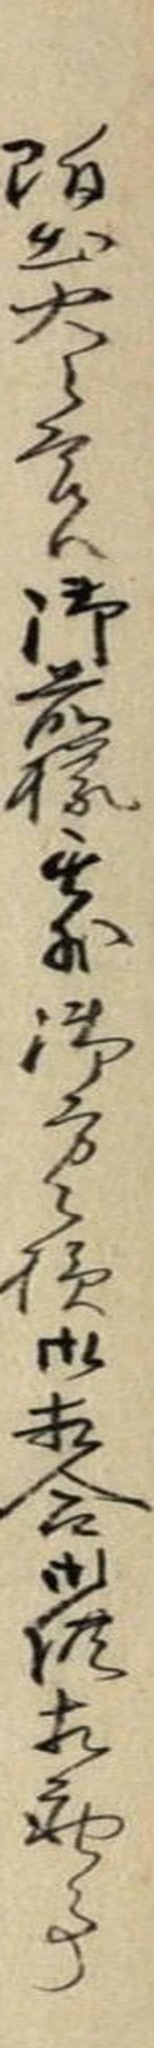附出火之節は御前様其外御方々様御相合御供相勤事
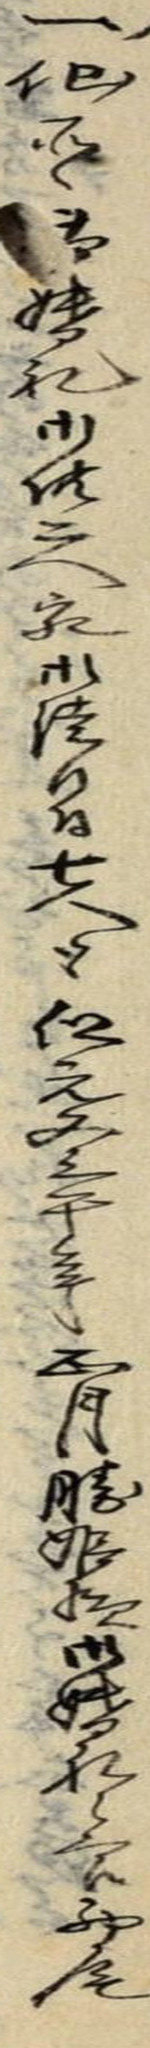一他所へ御婚礼御供二人宛御徒目付七人つゝ但元文三午年正月勝姫様御婚礼之節西尾
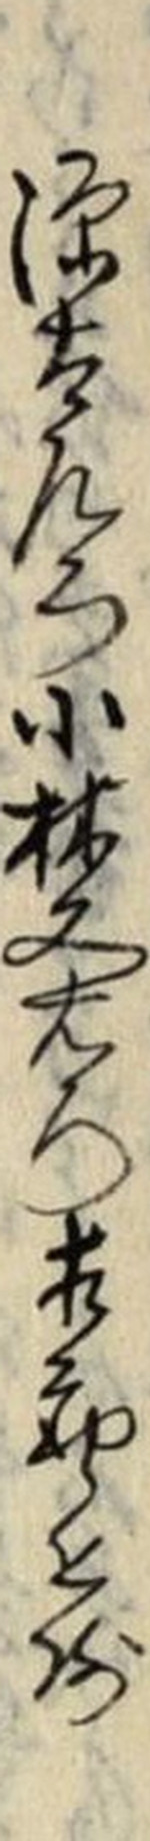源太左衛門小林久右衛門相勤近例
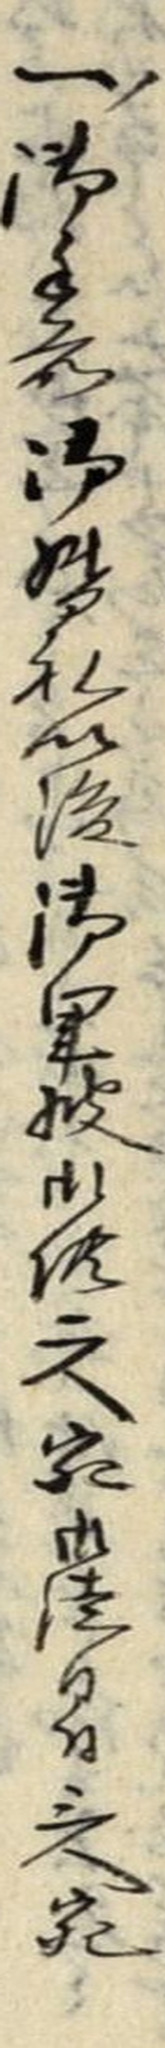一御手前御婚礼以後御里披御供二人宛御徒目付三人宛
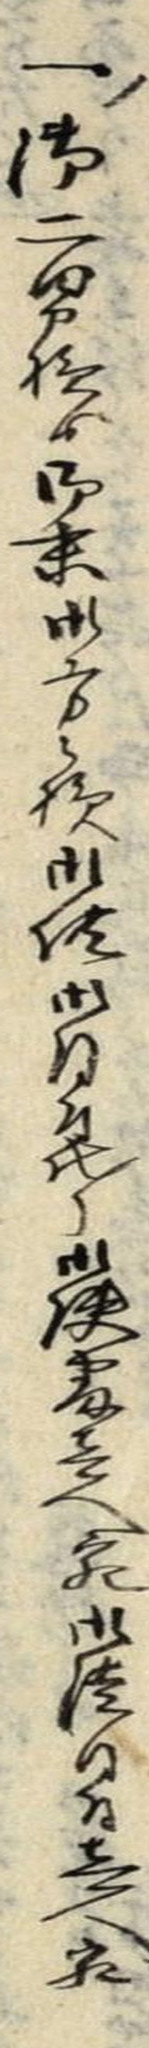一御二男様ゟ御末御方々様御供御目付代り御使番壱人宛御徒目付壱人宛
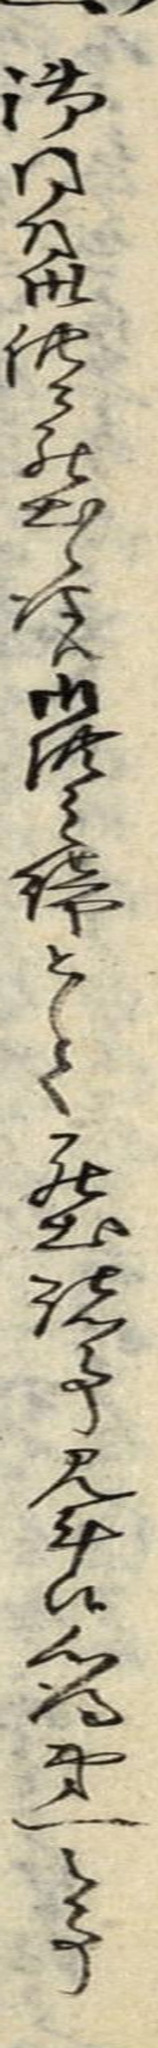一御目付御供に罷出候儀は御供之締として罷出諸事見計候心得第一之事
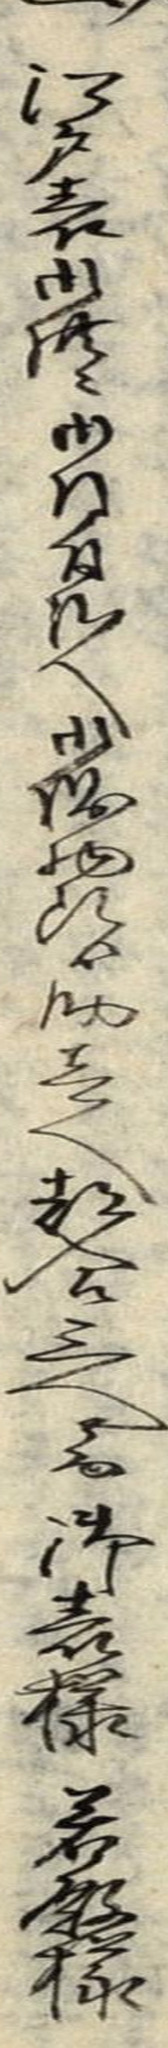一江戸表御供に御目付弐人御側物頭ゟ助壱人都合三人にて御表様若殿様
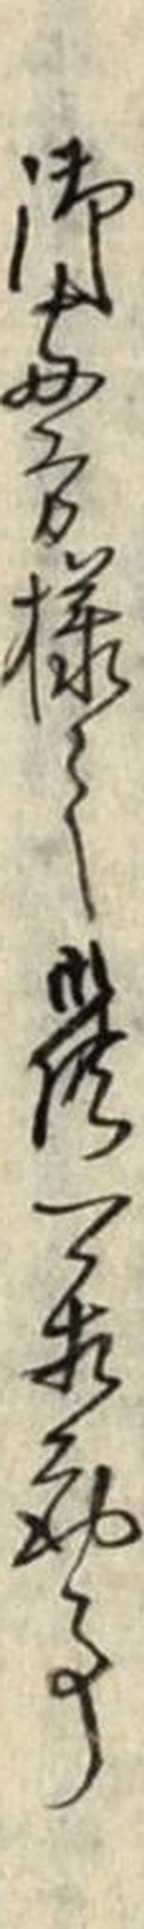御両方様之御供可相勤事
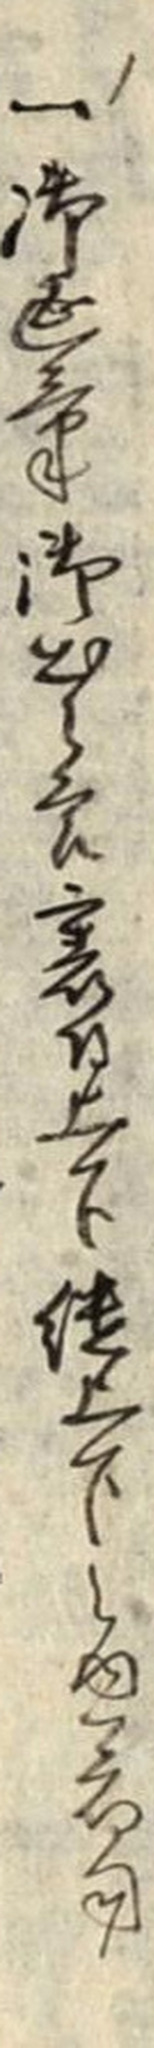一御延気御出之節裏付上下継上下之内着用
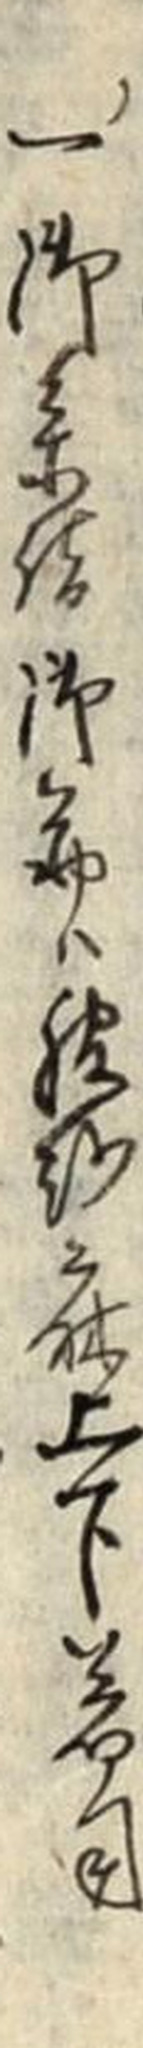一御参詣御勤は服紗麻上下着用
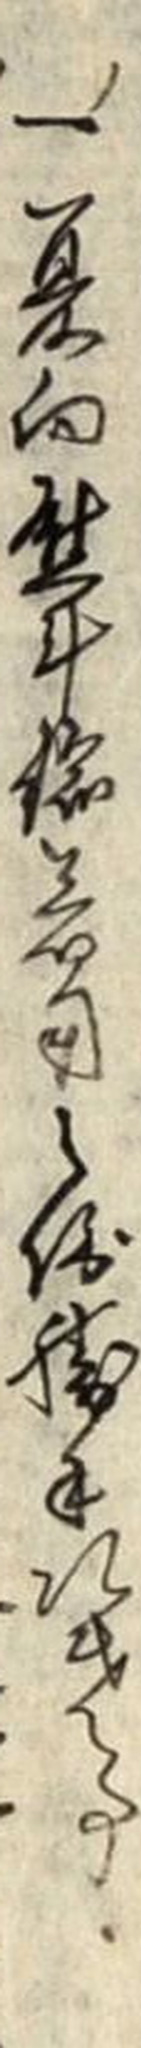一夏向熨斗縮着用之儀勝手次第之事
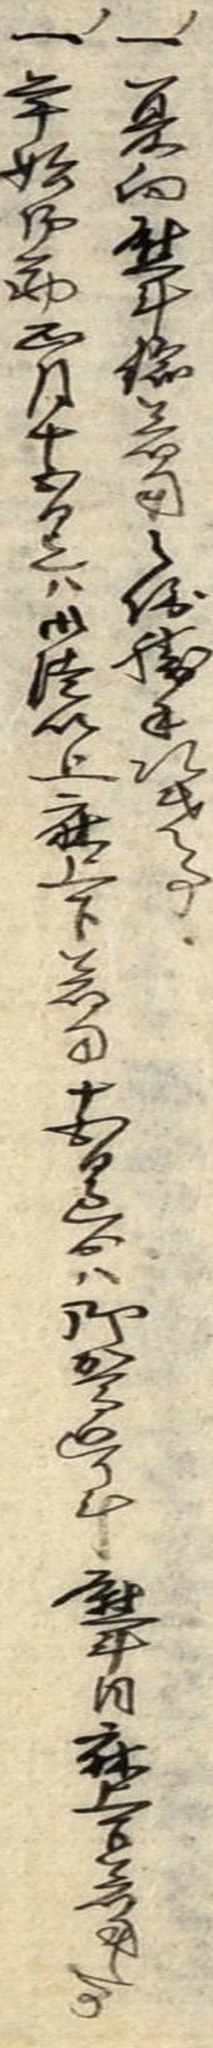一年始御勤正月十五日迄は御徒以上麻上下着用十五日過ゟは御駕廻り計熨斗目麻上下着用之事
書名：三都并道中之部
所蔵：福井県文書館 Fukui Prefectural Archives
